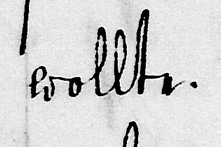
wollte.
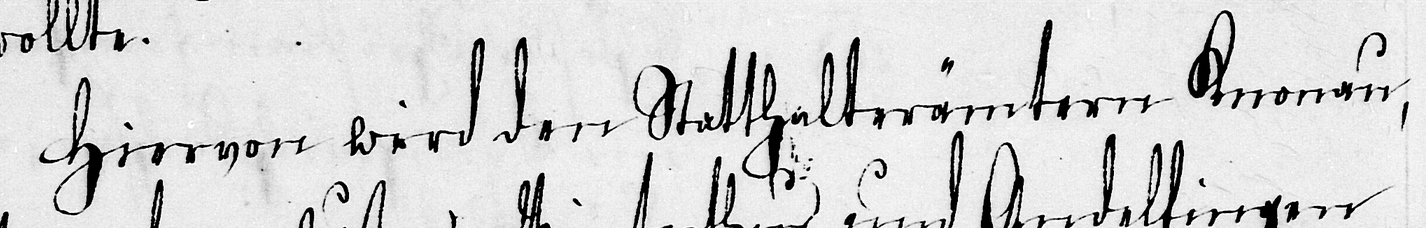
Hiervon wird den Statthalterämtern Knonau,
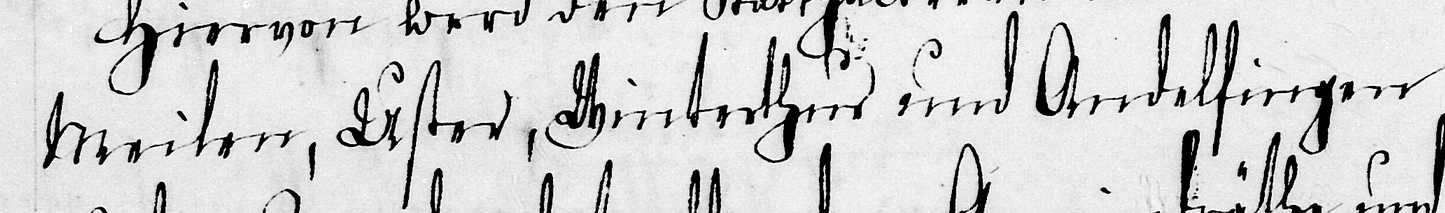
Meilen, Uster, Winterthur und Andelfingen
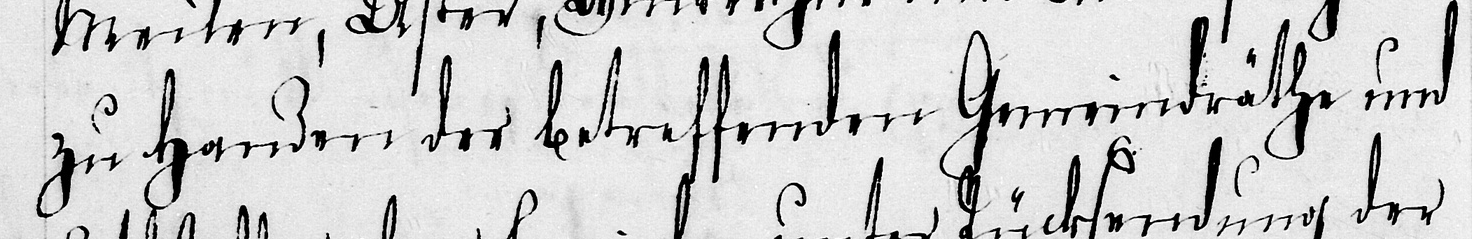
zu Handen der betreffenden Gemeindräthe und
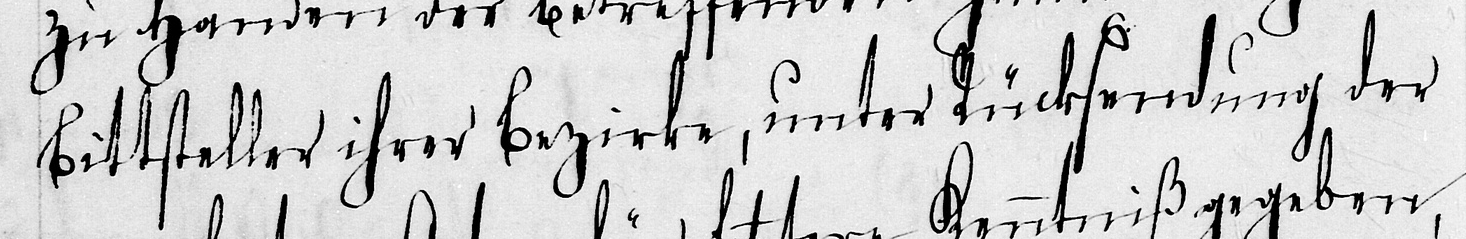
Bittsteller ihrer Bezirke, unter Rücksendung der
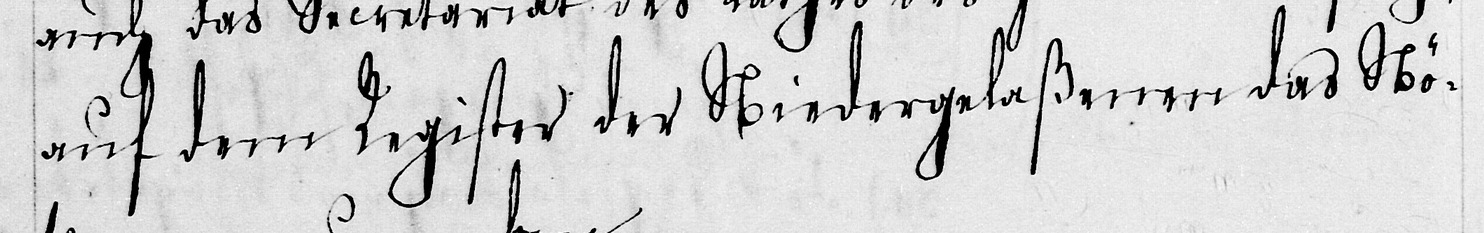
auf dem Register der Niedergelaßenen das Nö¬
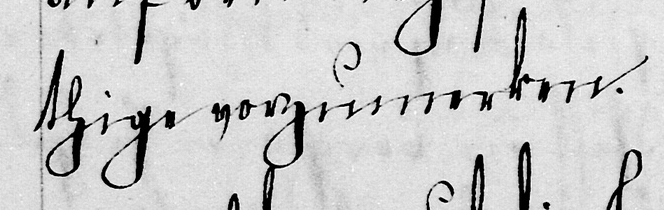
thige vorzumerken.
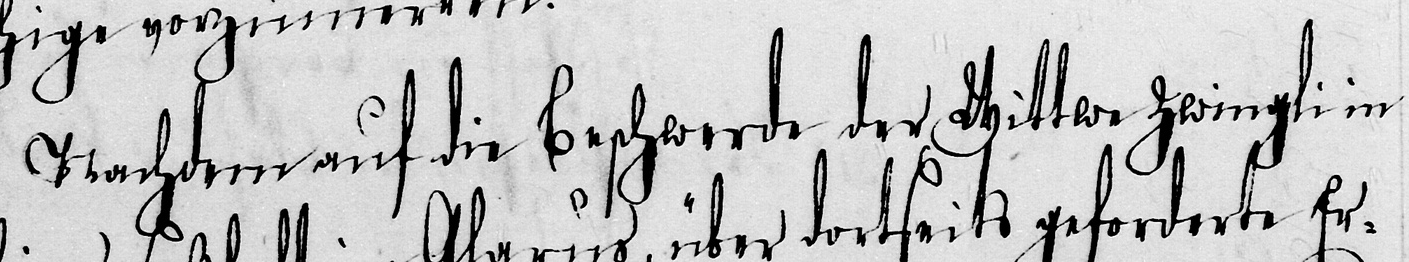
Nachdem auf die Beschwerde der Wittwe Zwingli in
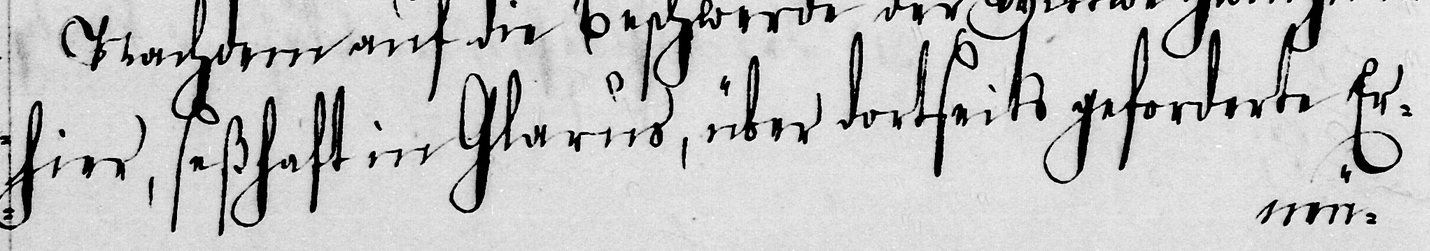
hier, seßhaft in Glarus, über dortseits geforderte E¬
